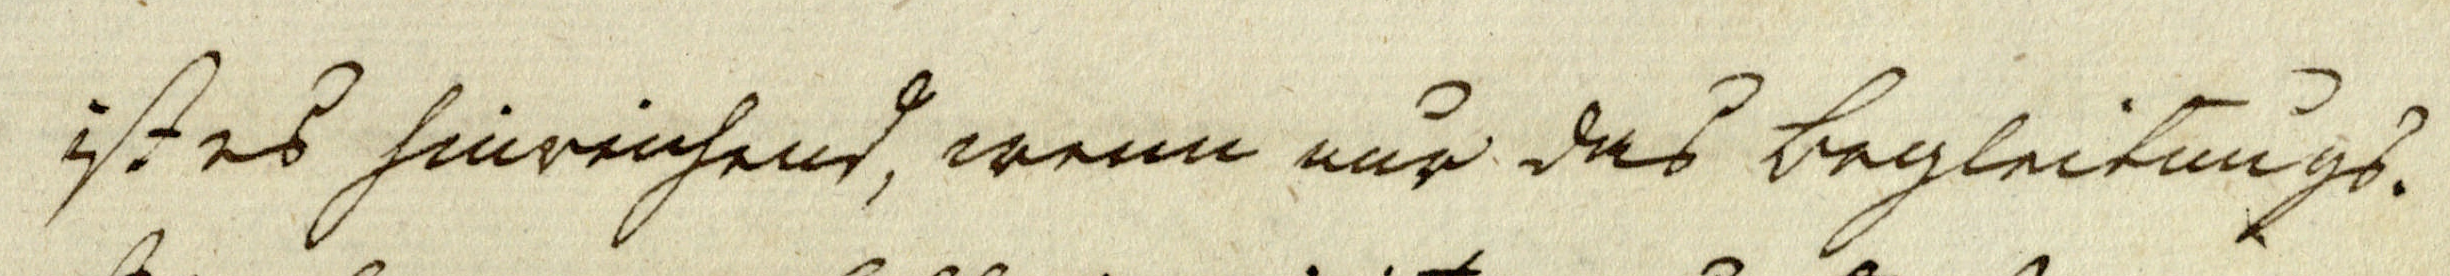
ist es hinreichend, wenn nur das Begleitungs¬
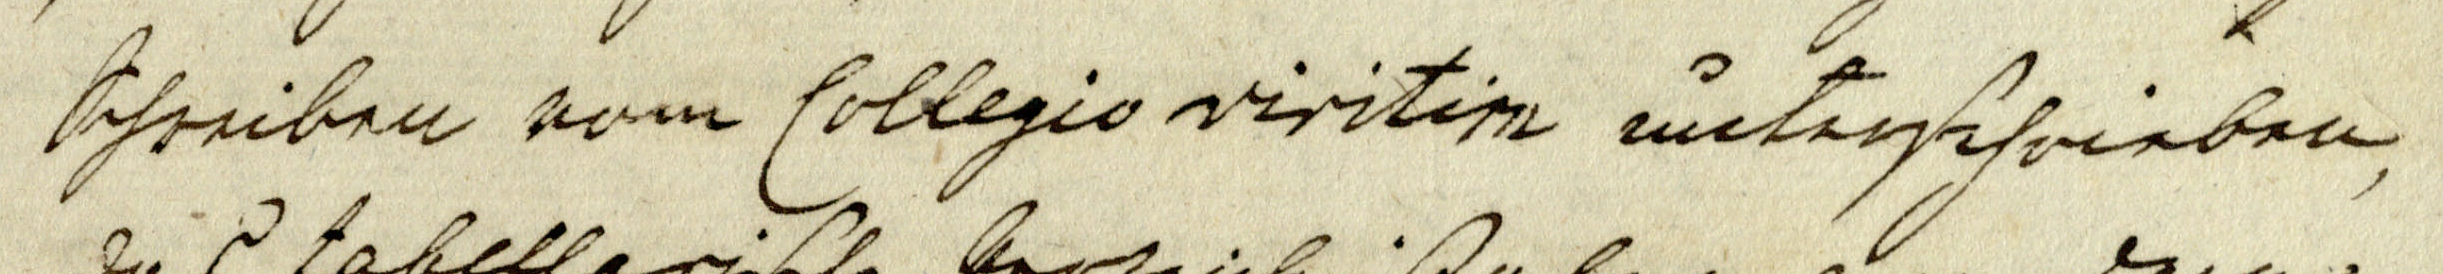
Schreiben vom Collegio viritim unterschrieben,
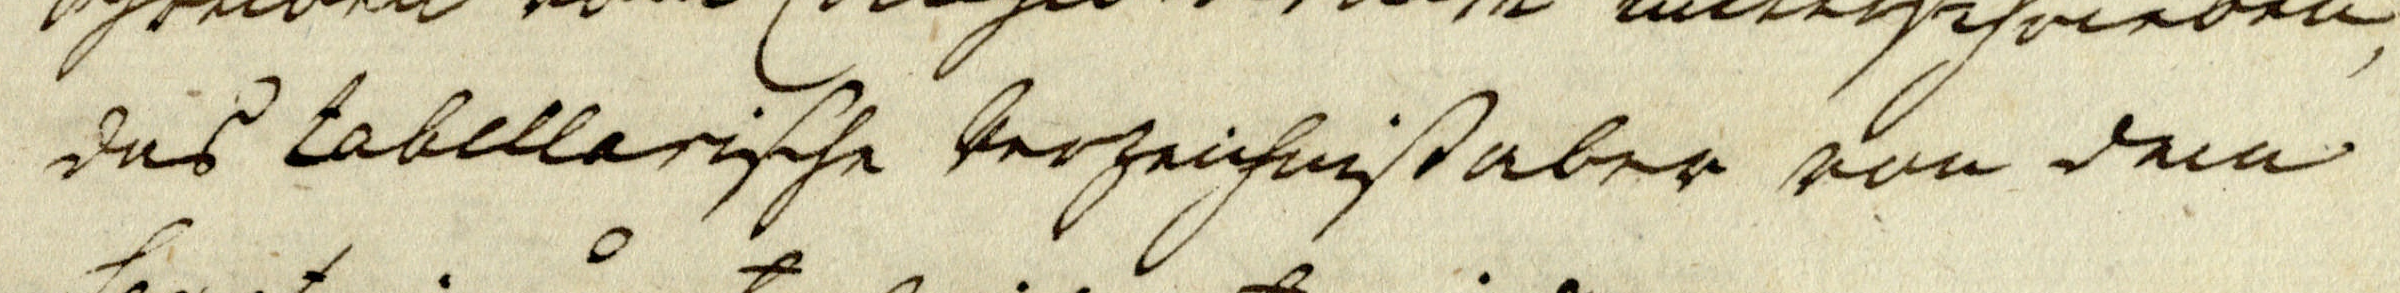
das tabellarische Verzeichnis aber von dem
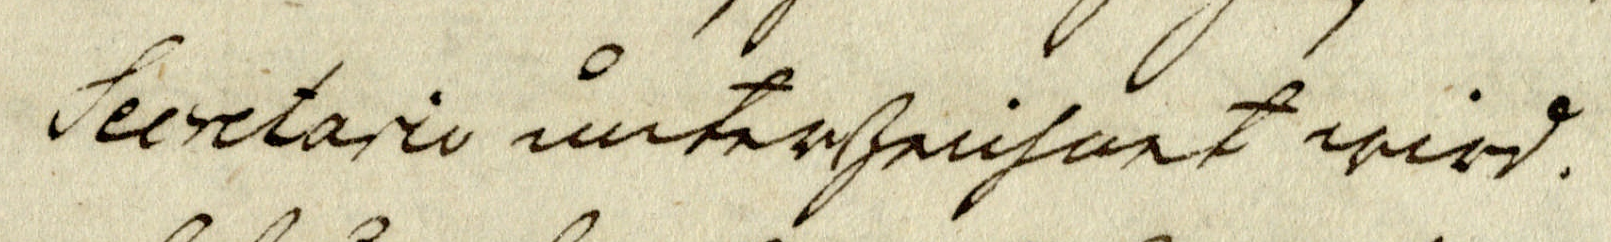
Secretario unterzeichnet wird.
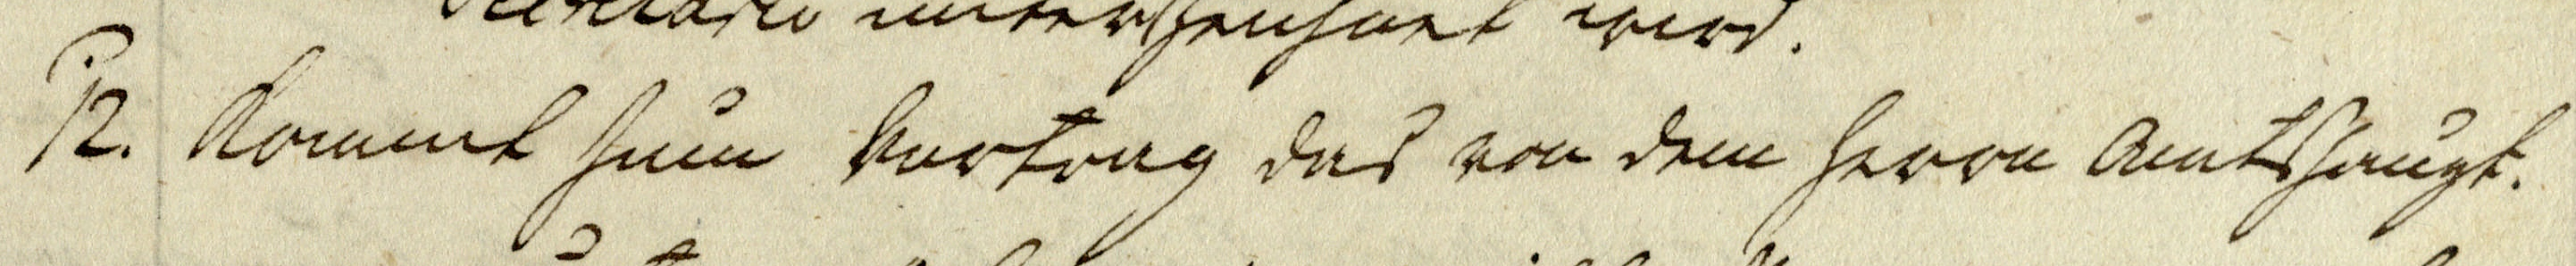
12. Kommt zum Vortrag das von dem Herrn Amtshaupt¬
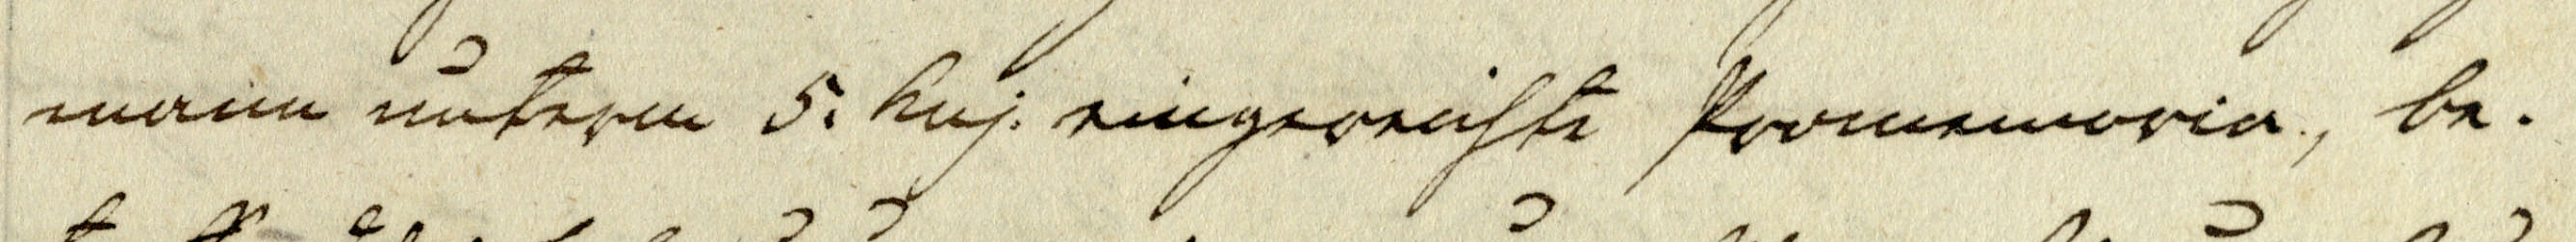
mann unterm 5. huj. eingereichte Promemoria, be¬
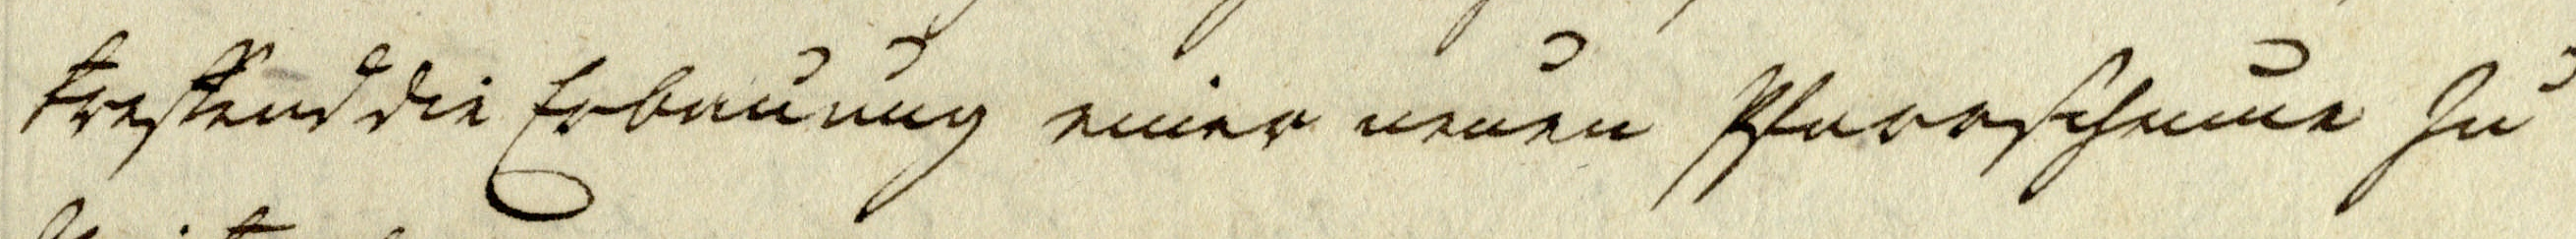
treffend die Erbauung einer neuen Pfarrscheune zu
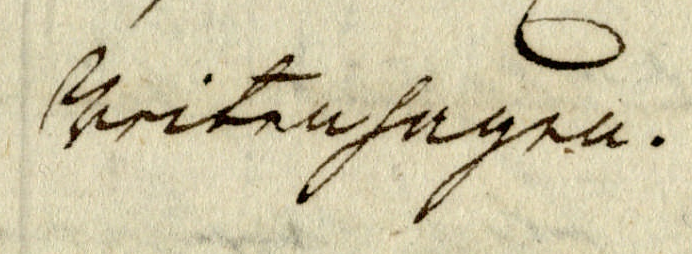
Weitenhagen.
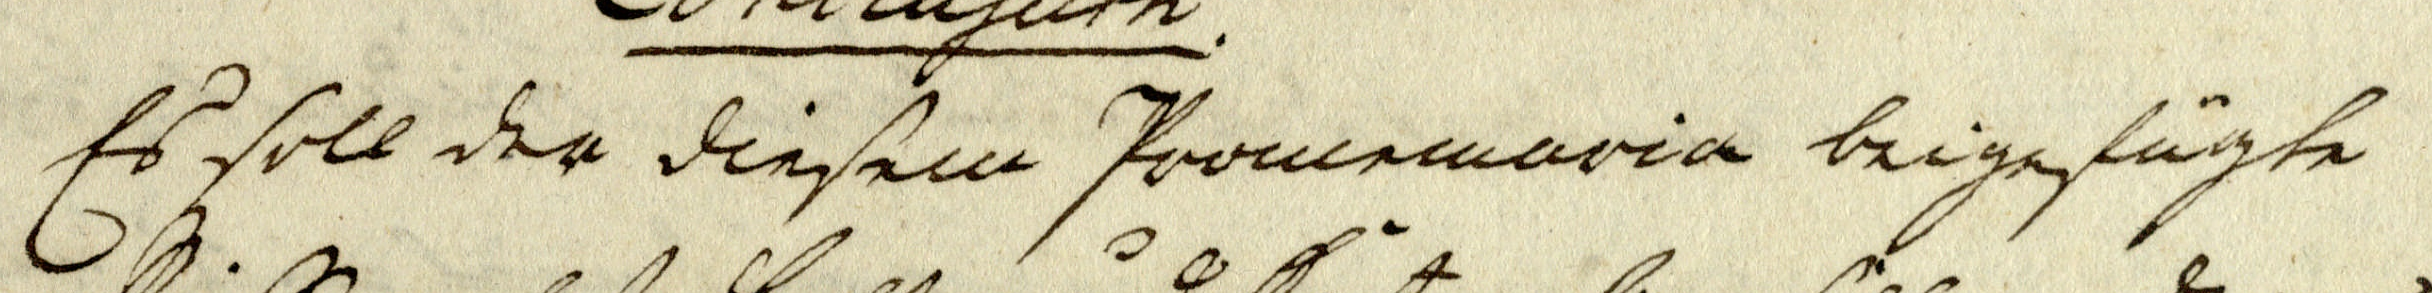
Es soll der diesem Promemoria beigefügte
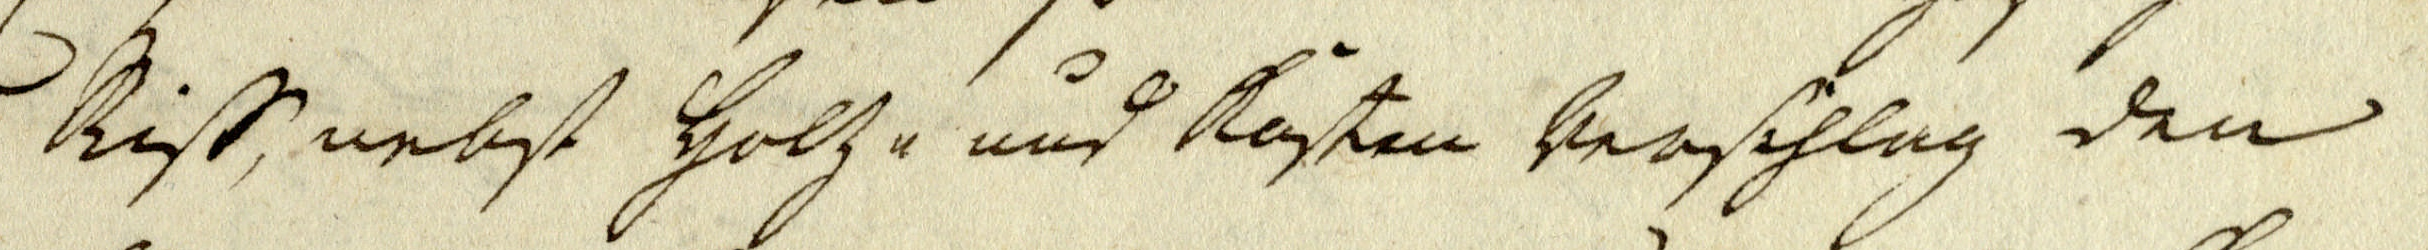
Riß, nebst Holz und Kosten Verschlag den
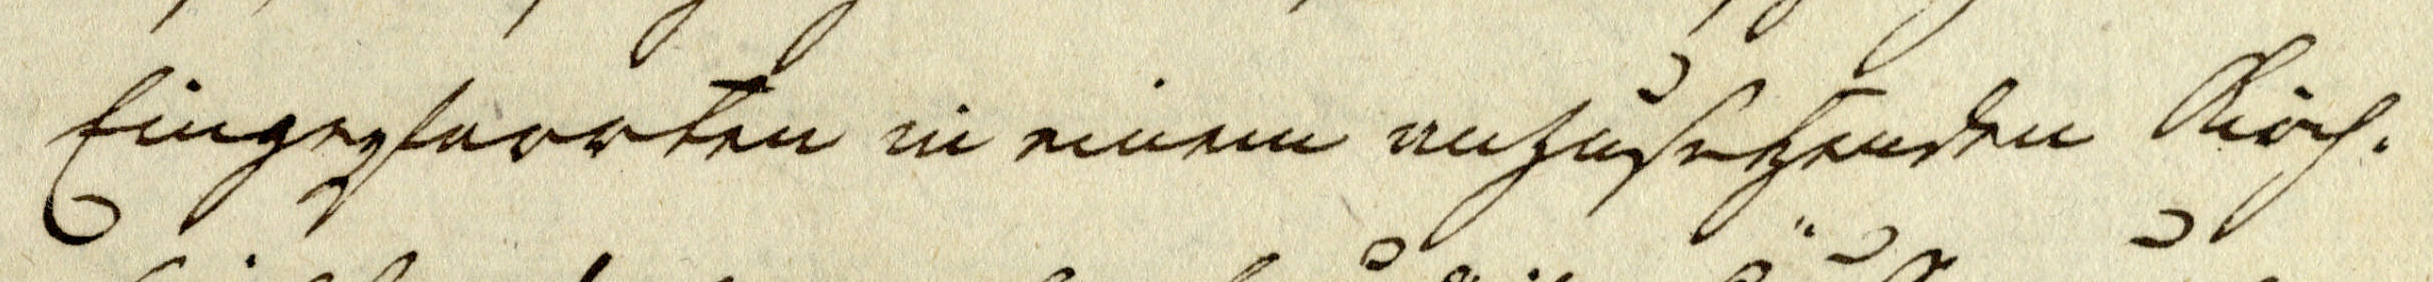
Eingepfarrten in einem anzusetzenden Kirch¬
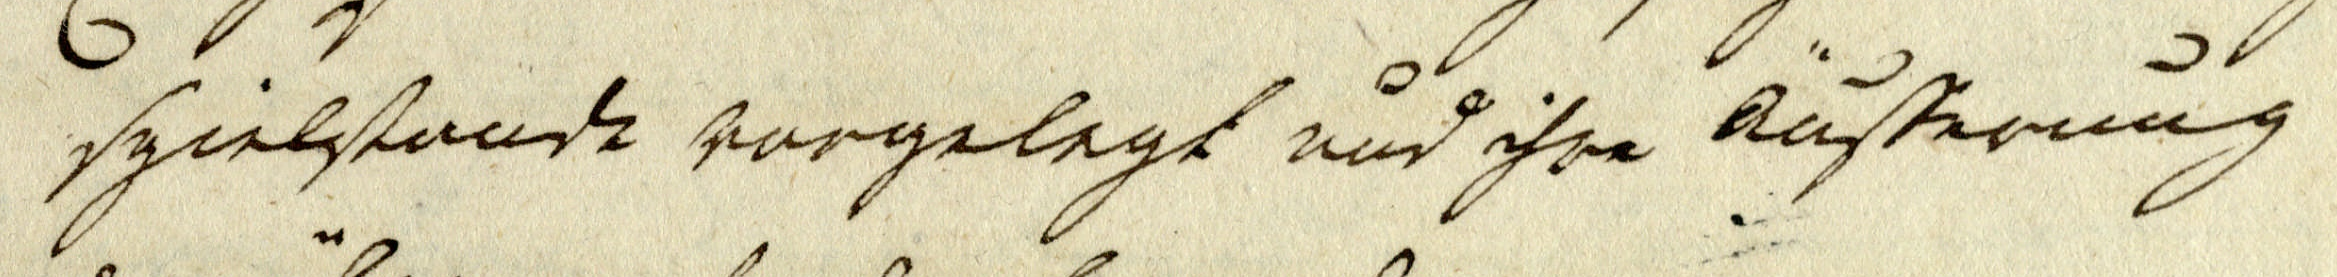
spielstande vorgelegt und ihre Äusserung
